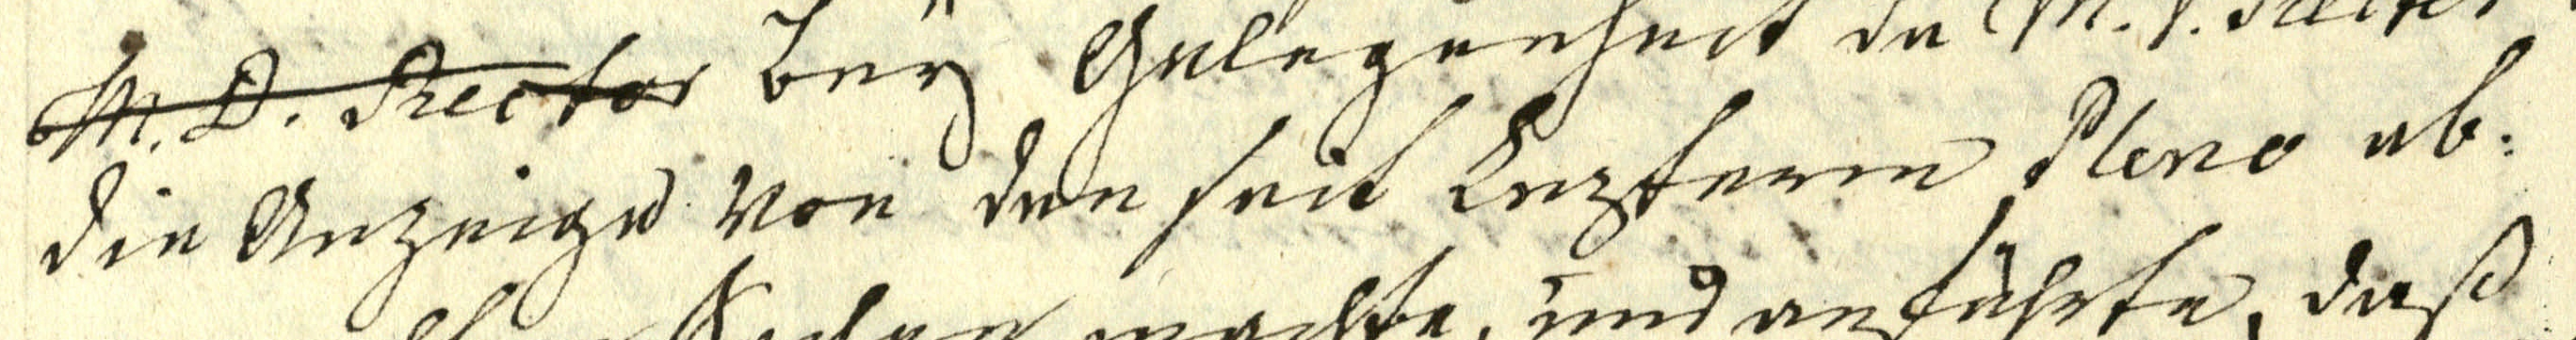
die Anzeige von den seit lezterm Pleno ab¬
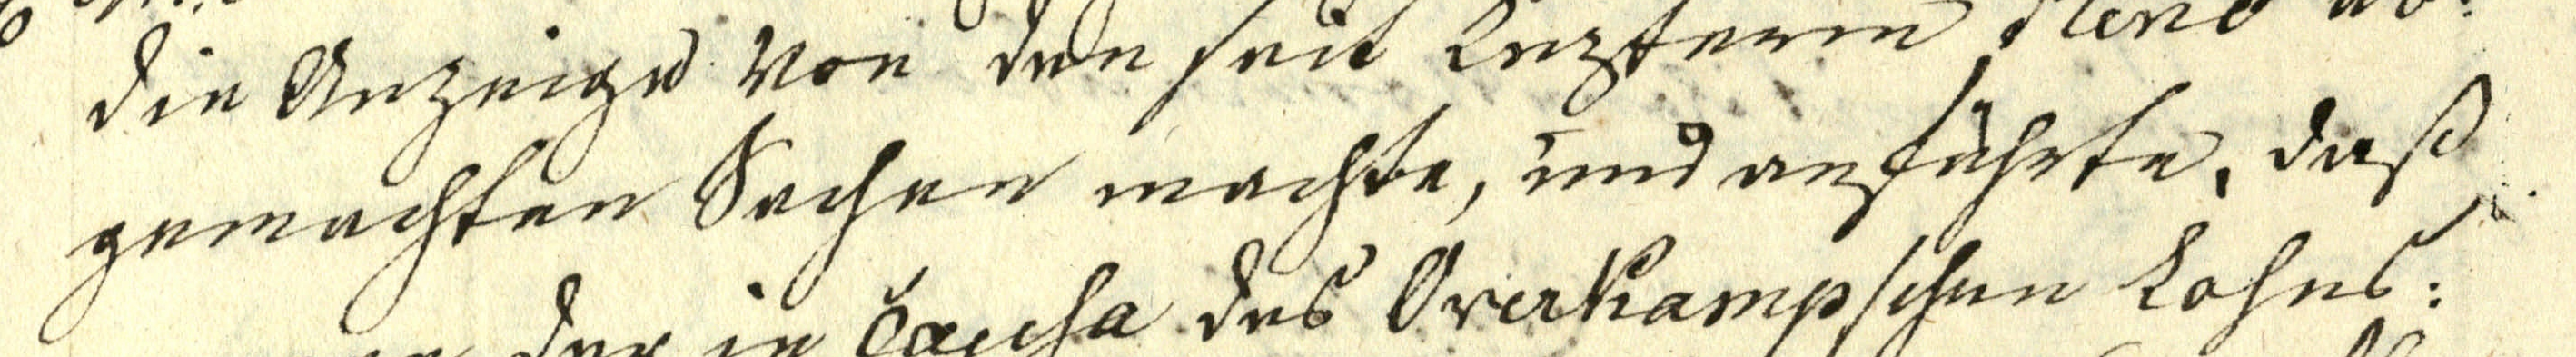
gemachten Sachen machte, und anführte, daß
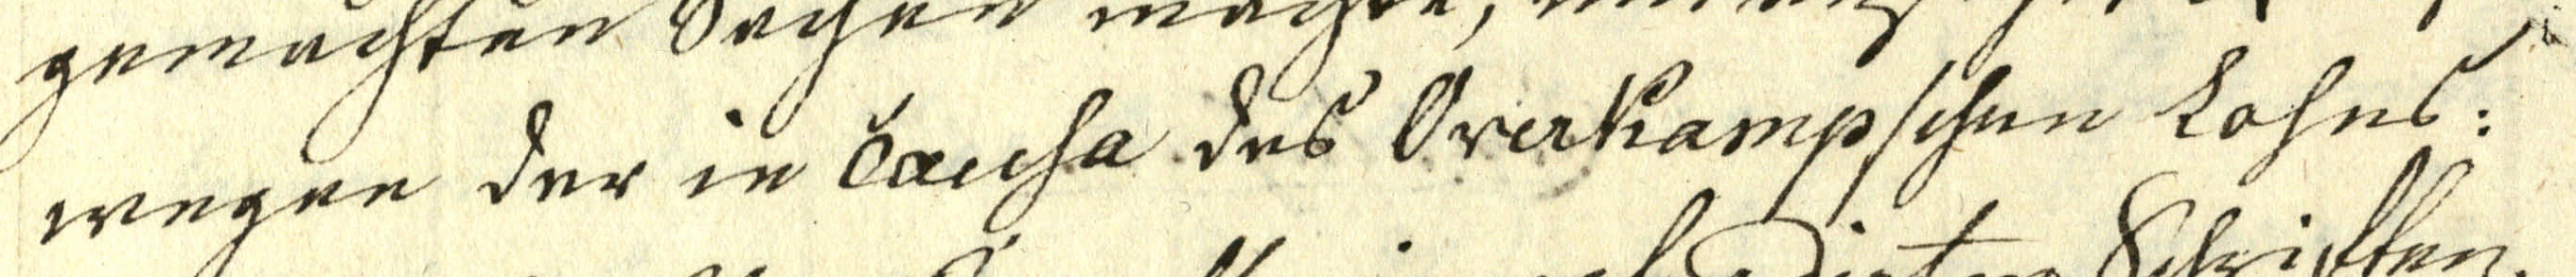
wegen der in Causa des Overkampschen Lohns¬
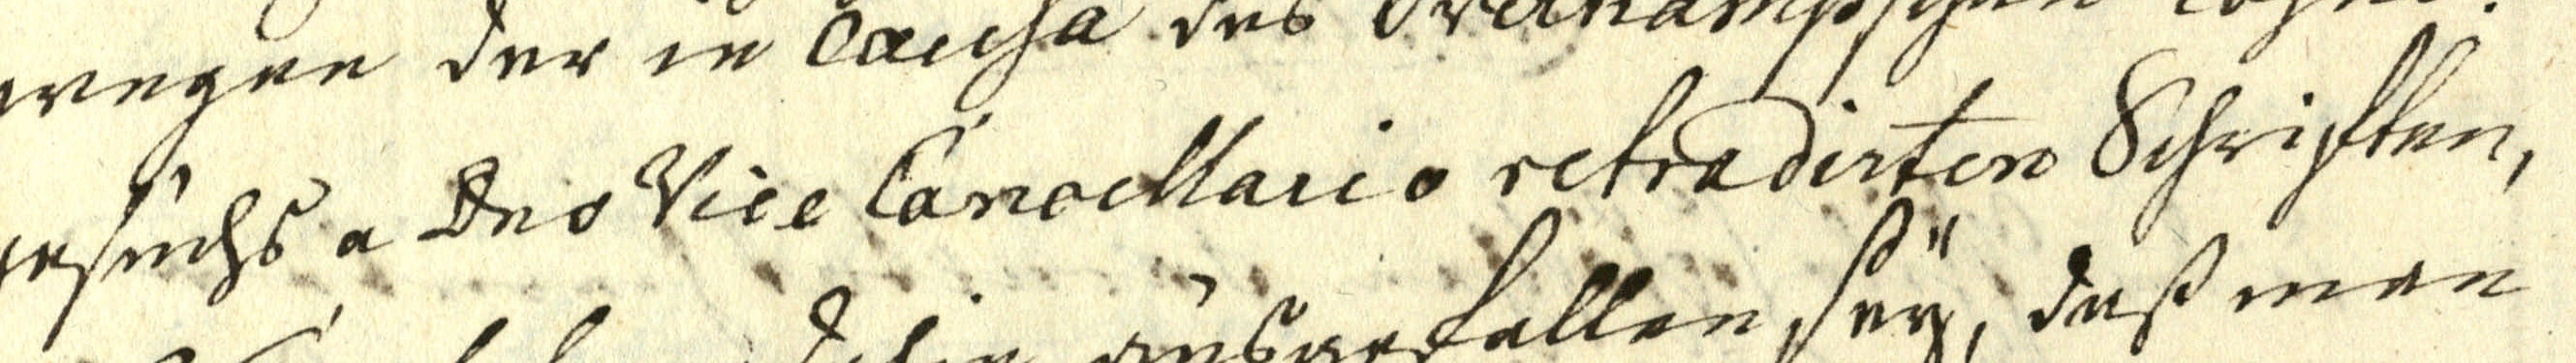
gesuchs a Dno ViceCancellarii retradirten Schriften,
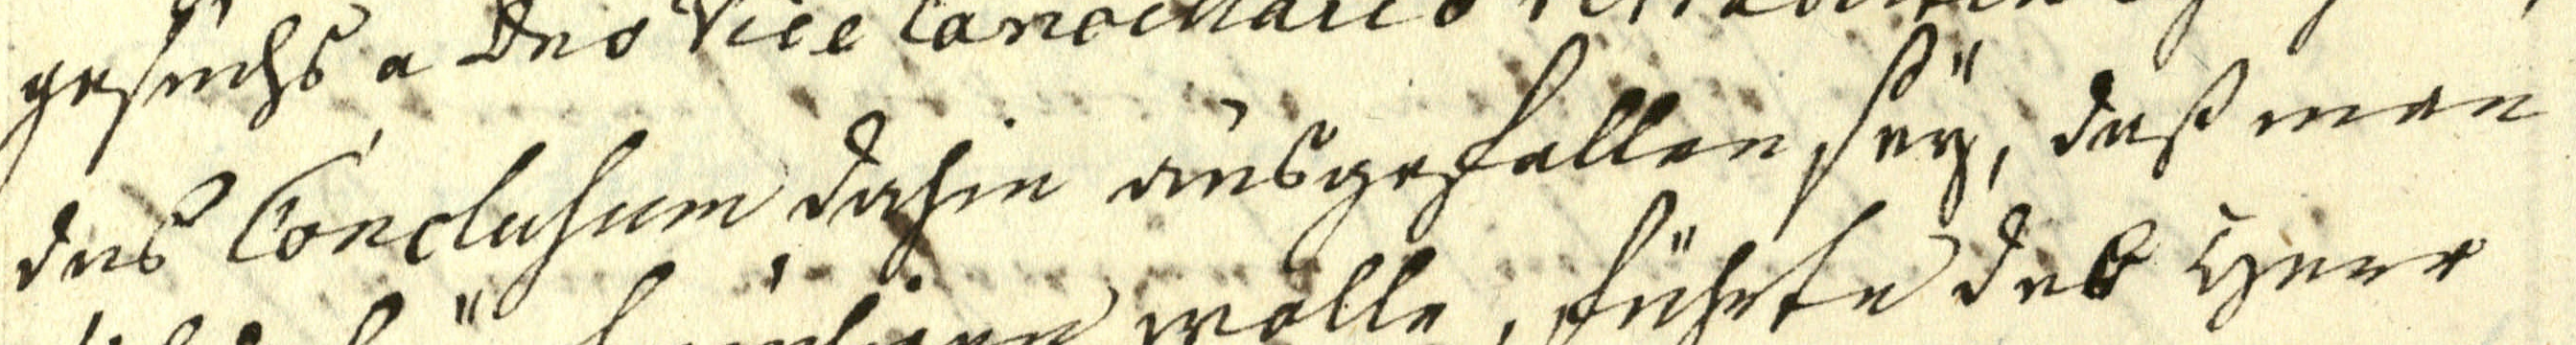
das Conclusum dahin ausgefallen seÿ, daß man
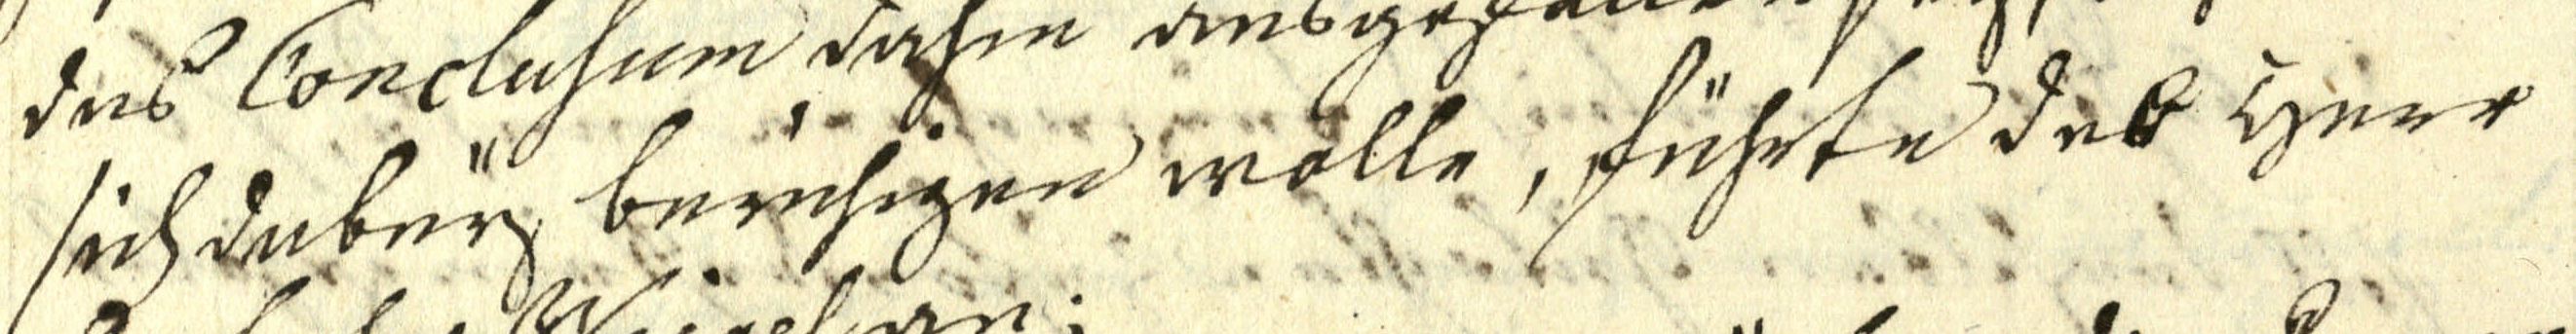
sich daher beruhigen wolle, führte des Herr
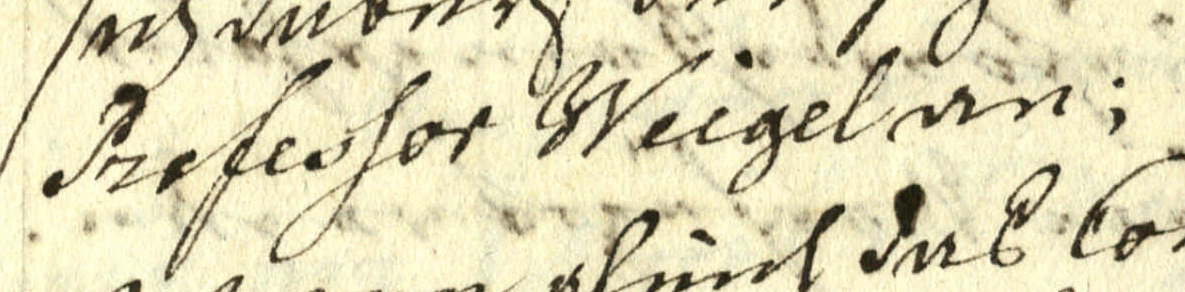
Professor Weigel an:
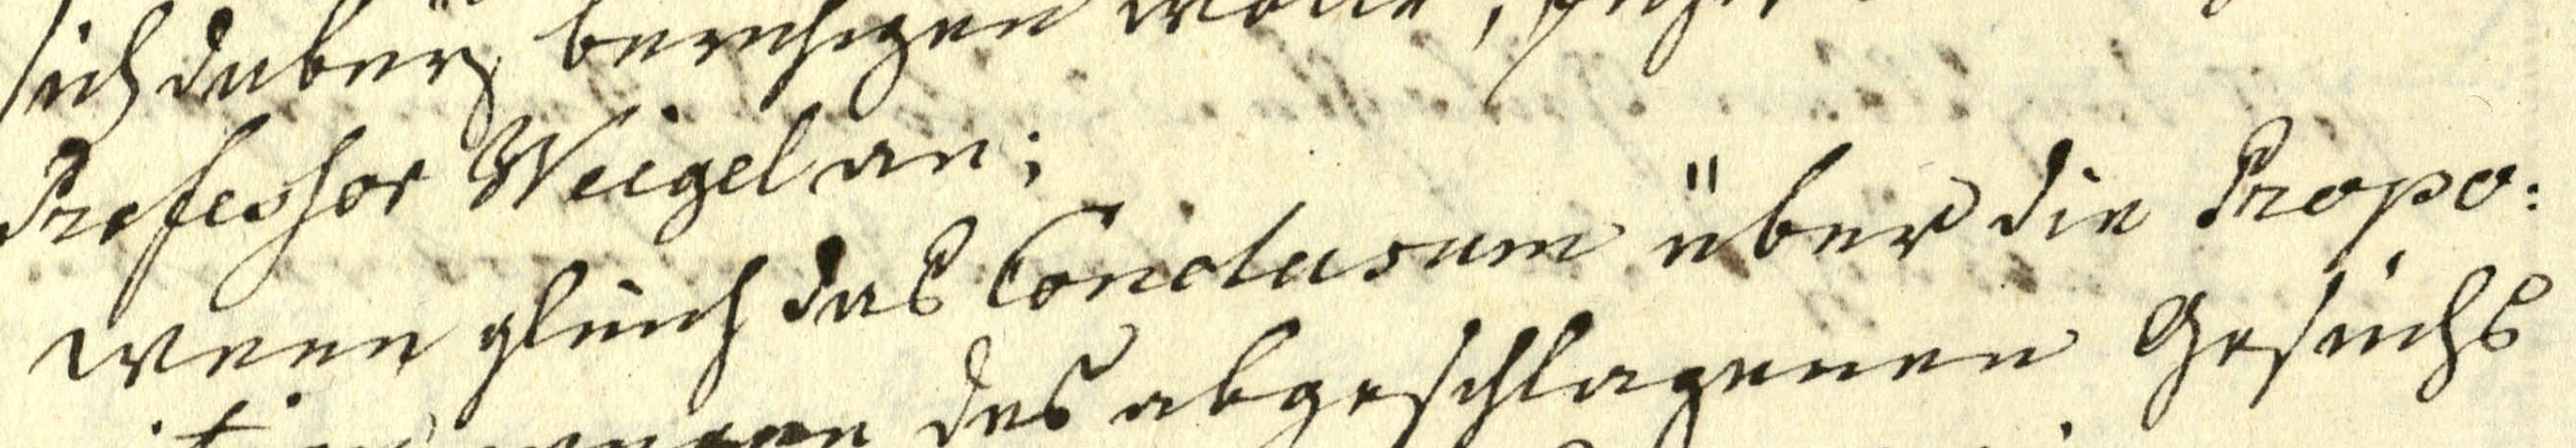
wenn gleich das Conclusum über die Propo¬
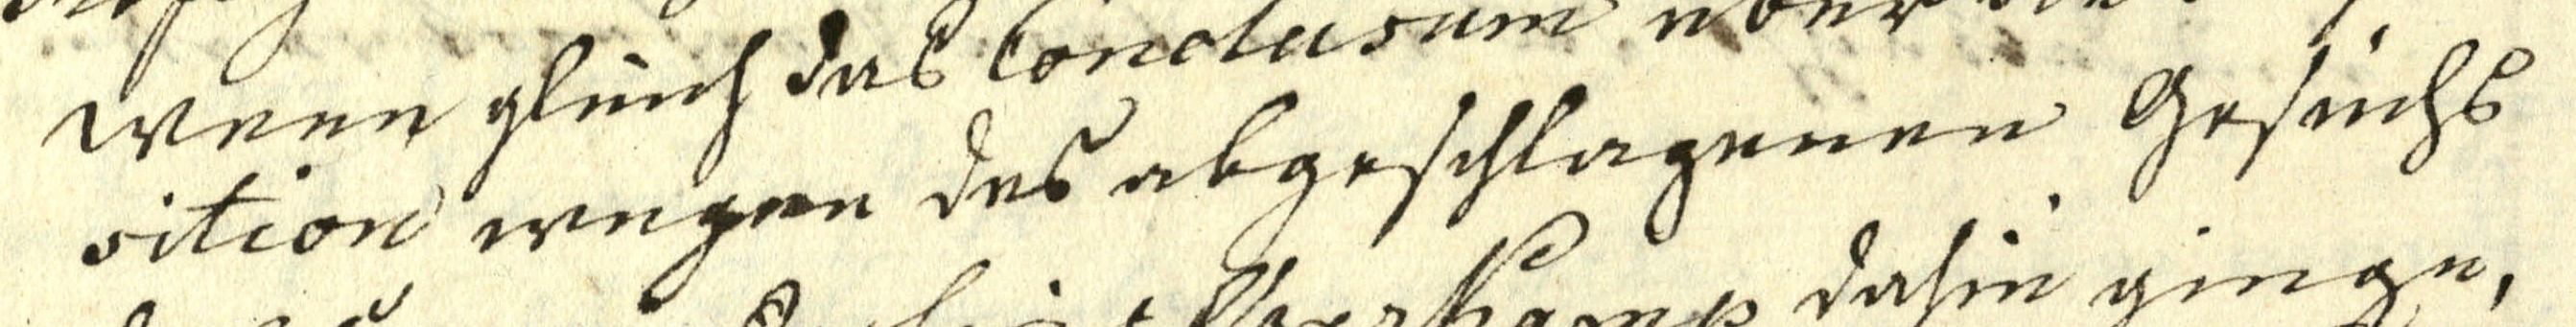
sition wegen des abgeschlagenen Gesuchs
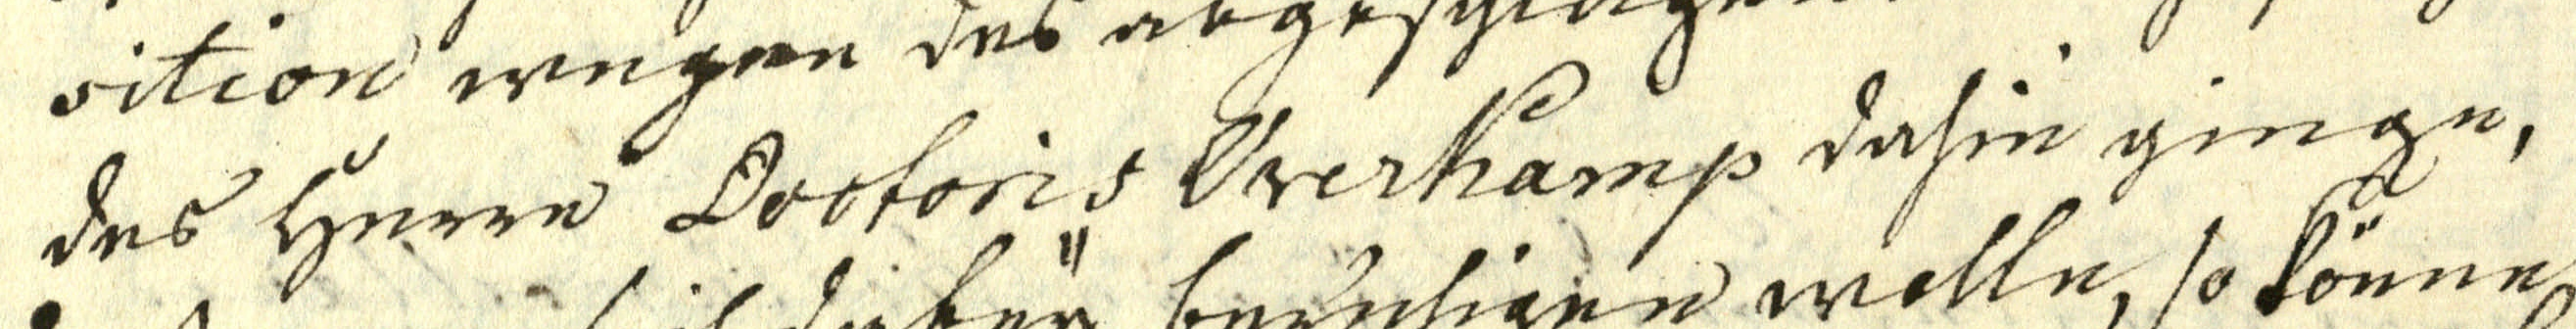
des Herrn Doctoris Overkamp dahin ginge,
